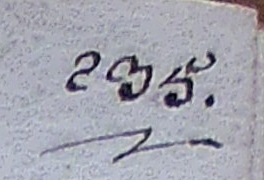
235.
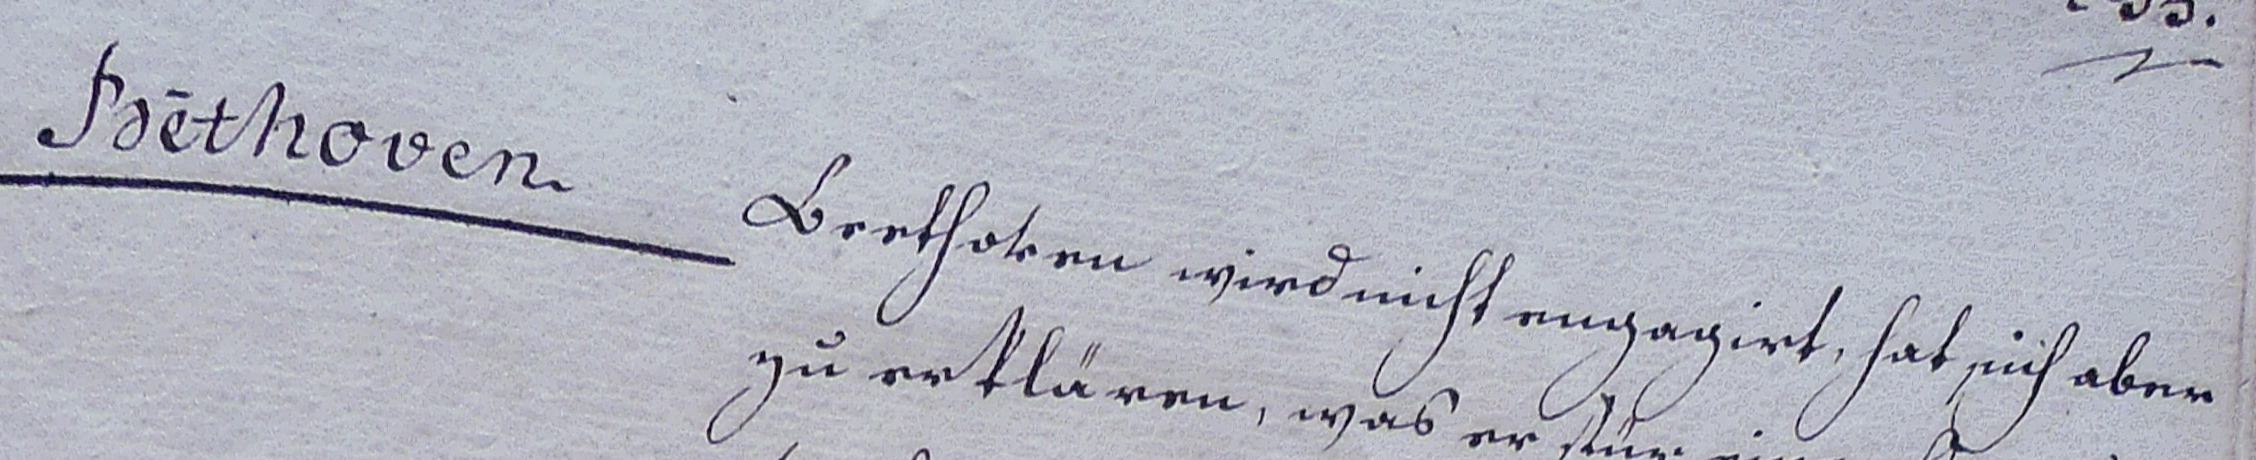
Be̅thoven. Beethoven wird nicht engagirt, hat sich aber
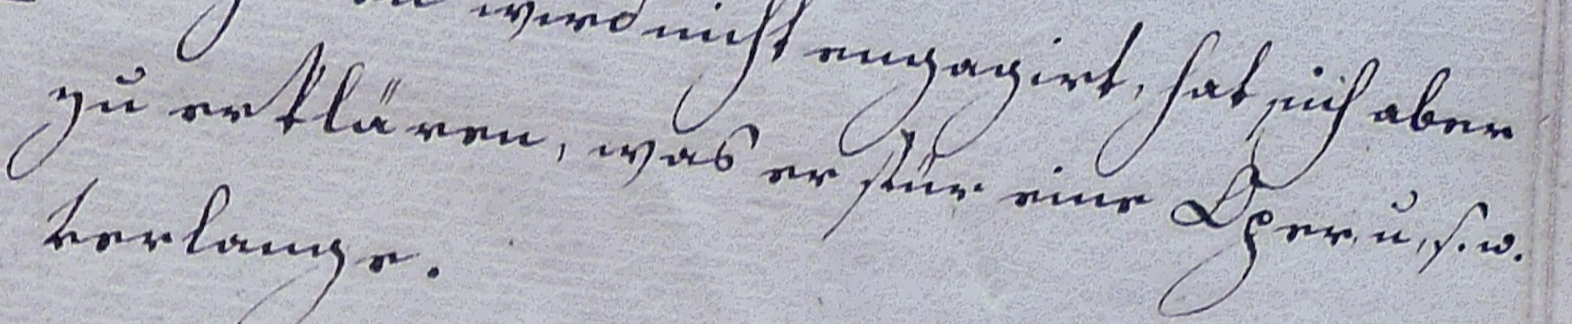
zu erklären, was er für eine Oper u.s.w.
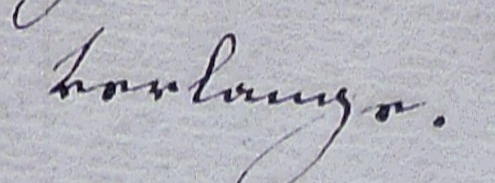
verlange.
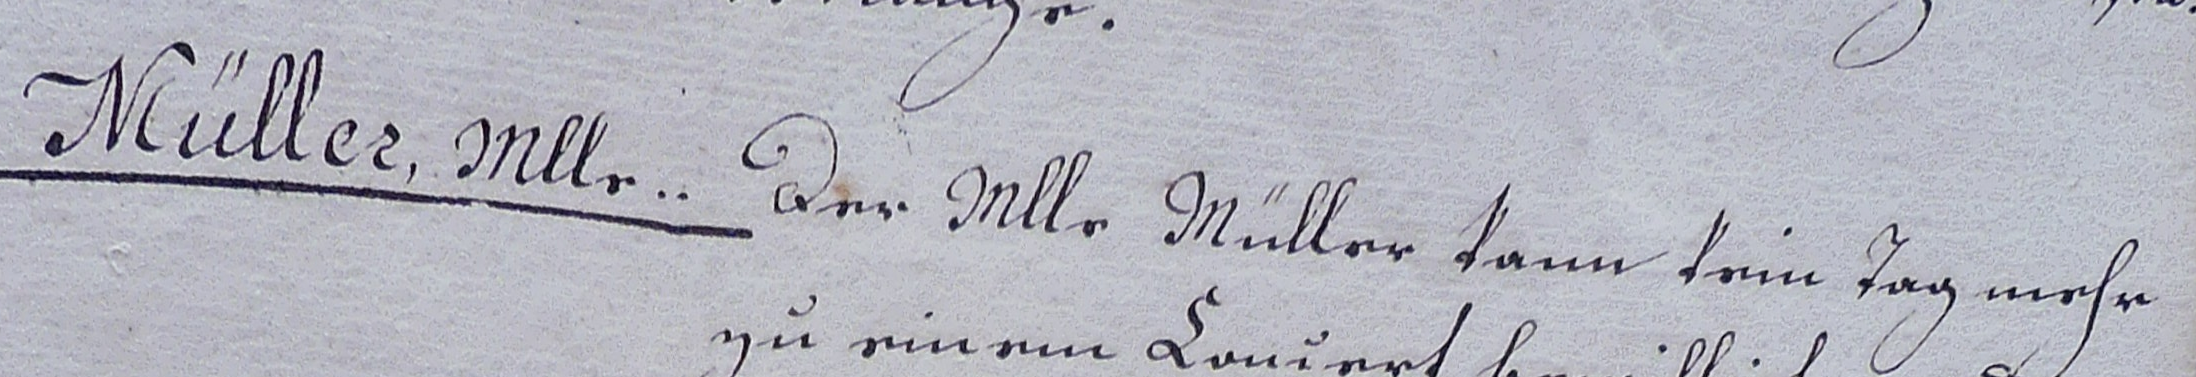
Müller, Mlle .. Der Mlle Müller kann kein Tag mehr
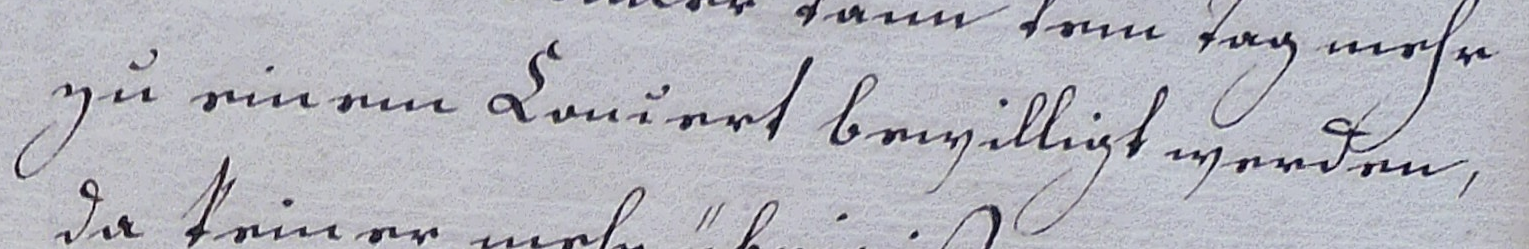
zu einem Concert bewilligt werden,
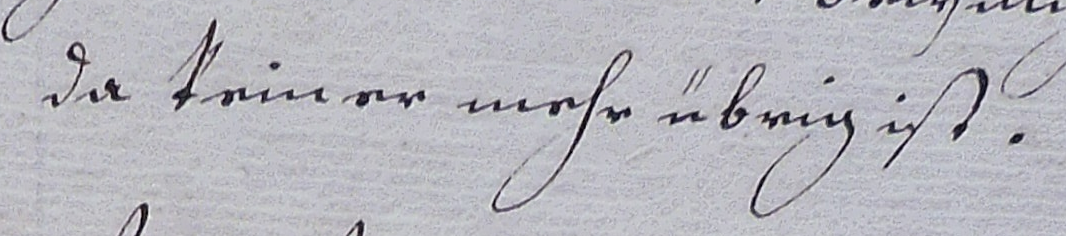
da keiner mehr übrig ist.
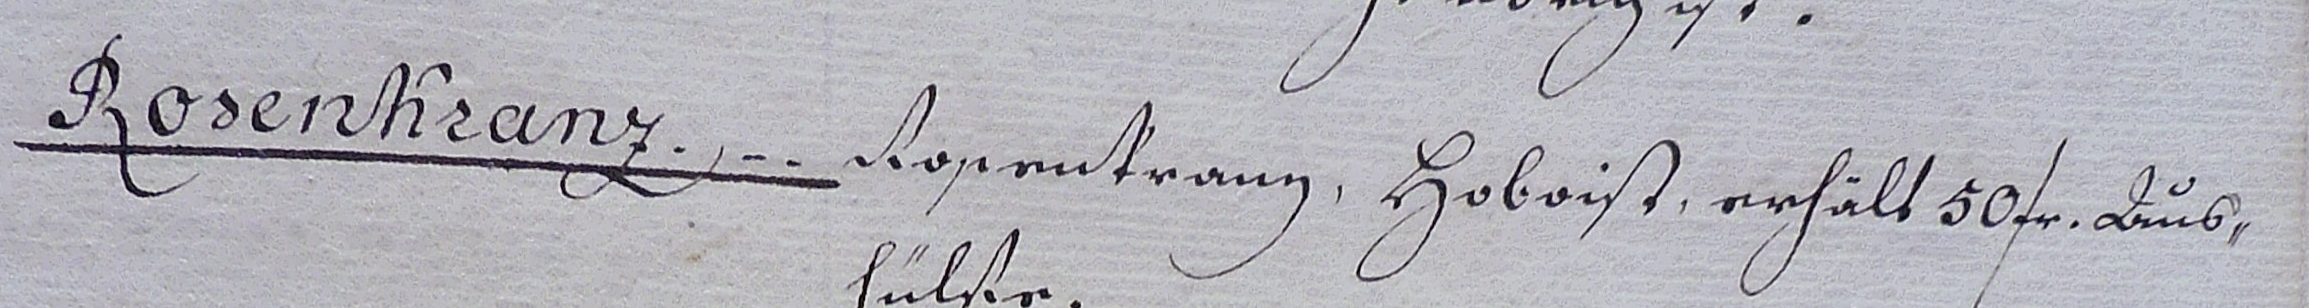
Rosenkranz. .. . Rosenkranz, Hoboist, erhält 50fr. Aus¬
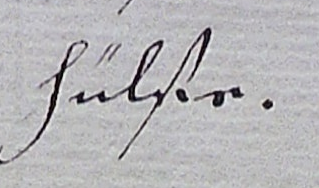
hülfe.
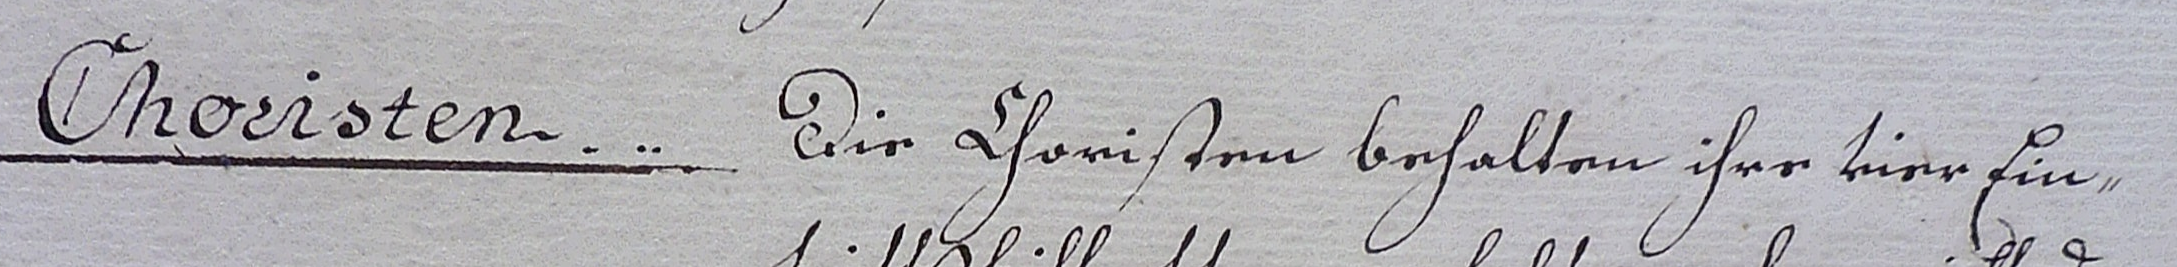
Choristen. .. Die Choristen behalten ihre vier Ein¬
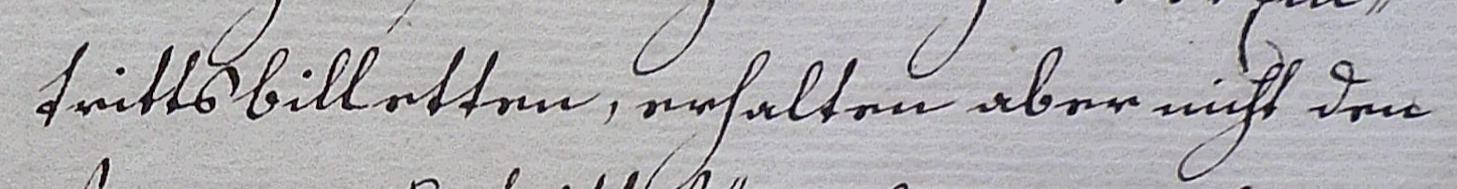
trittsbilletten, erhalten aber nicht den
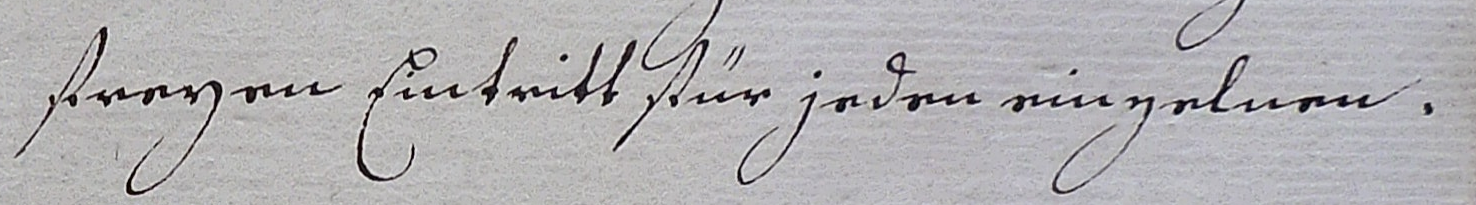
freyen Eintritt für jeden einzelnen.
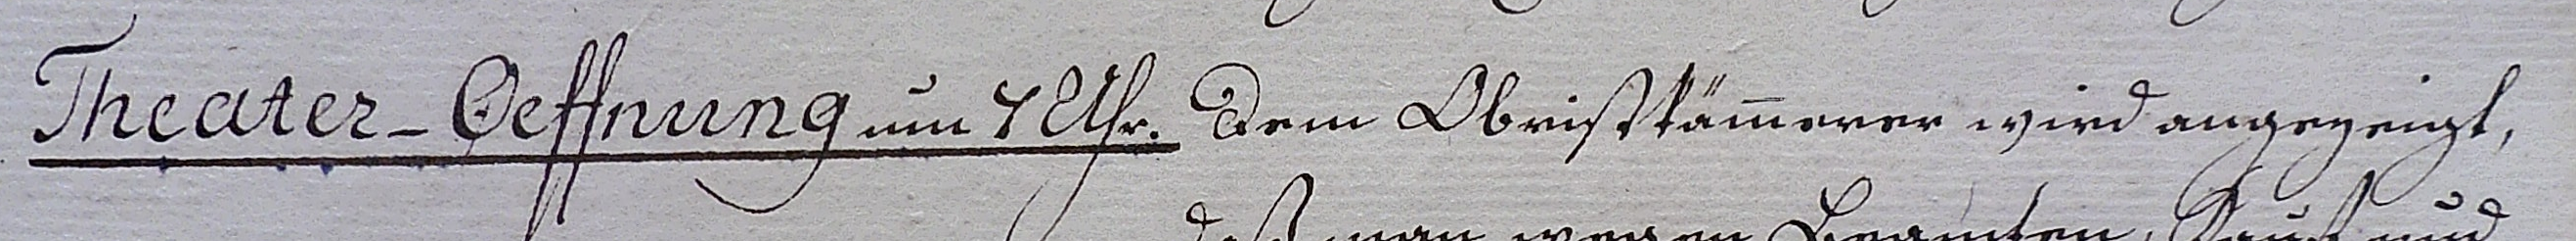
Theater‗Oeffnung um 7 Uhr. Den Obristkäm̅erer wird angezeigt,
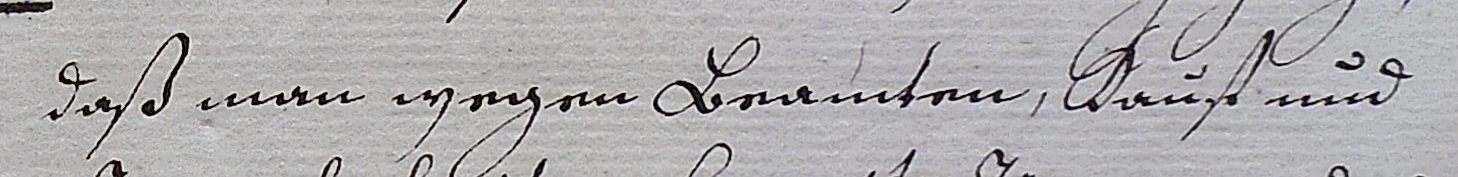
daß man wegen Beamten, Kauf und
